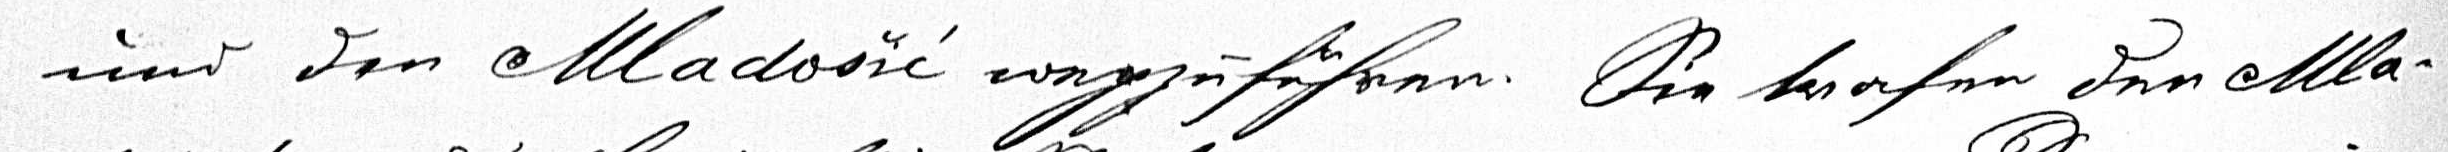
und den Mladošić wegzuführen. Sie trafen den Mla¬
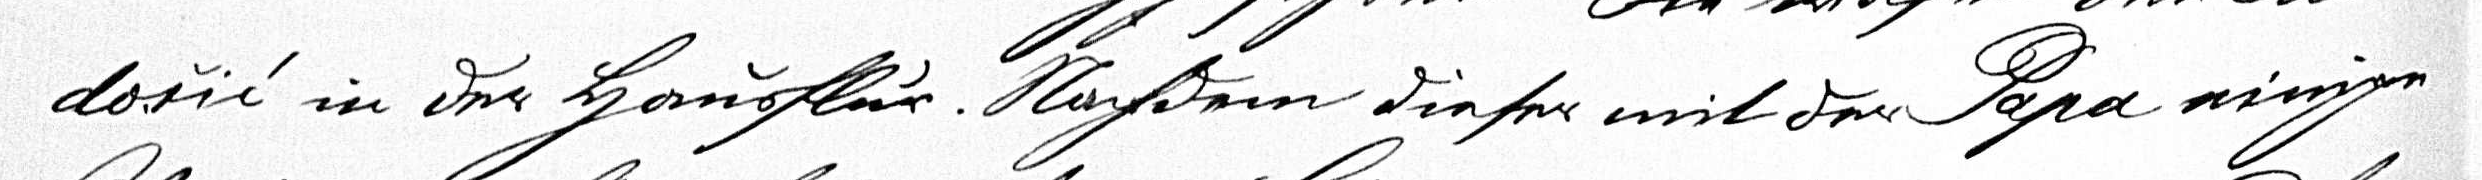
došić in der Hausflur. Nachdem dieser mit der Papa einige
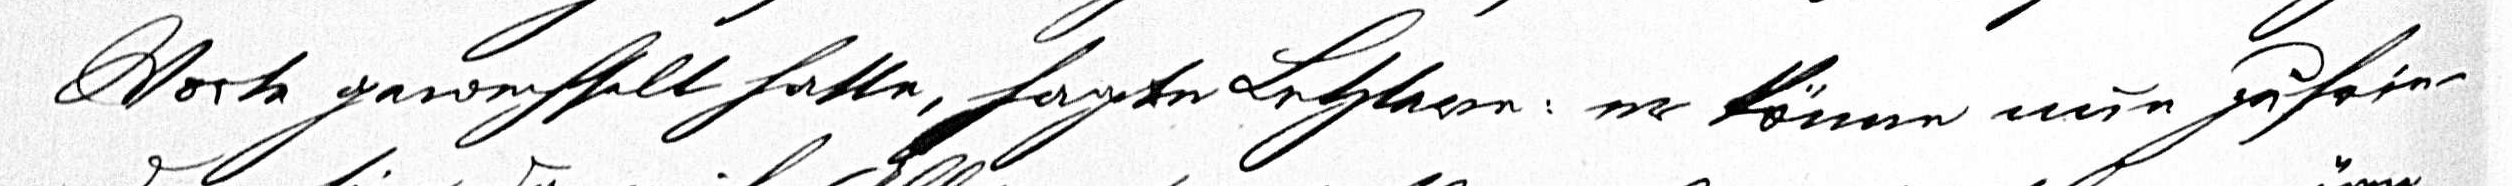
Worte gewechselt hatte, sagte Letztere: er könne nun zufrie¬
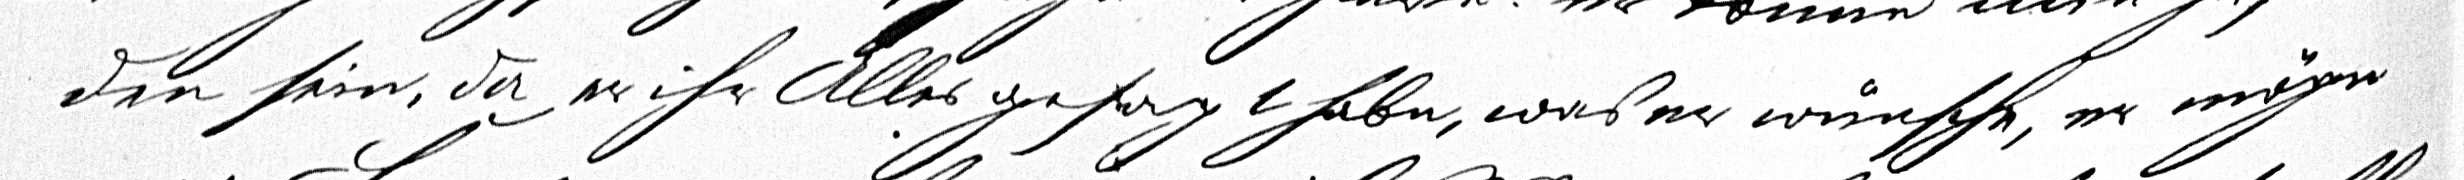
den sein, da er ihr Alles gesagt habe, was er wünsche, er möge
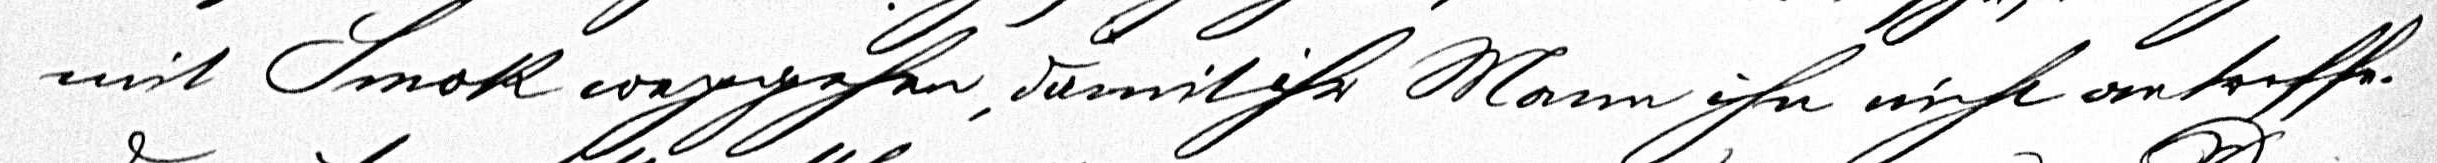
mit Smok weggehen, damit ihr Mann ihn nicht antreffe.
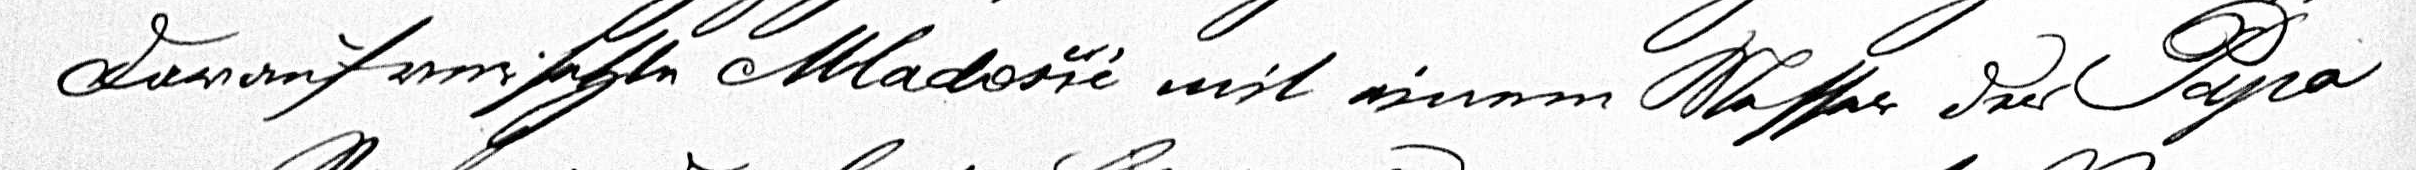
Darauf versetzte Mladošić mit einem Messer der Papa
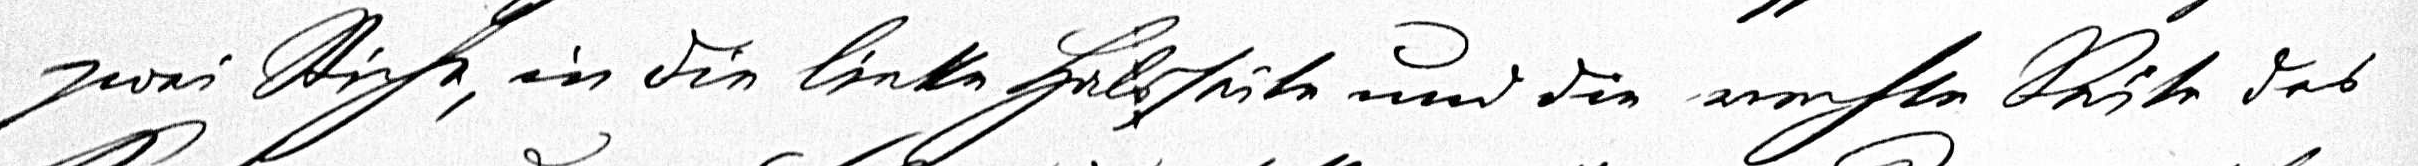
zwei Stiche, in die linke Halsseite und die rechte Seite des
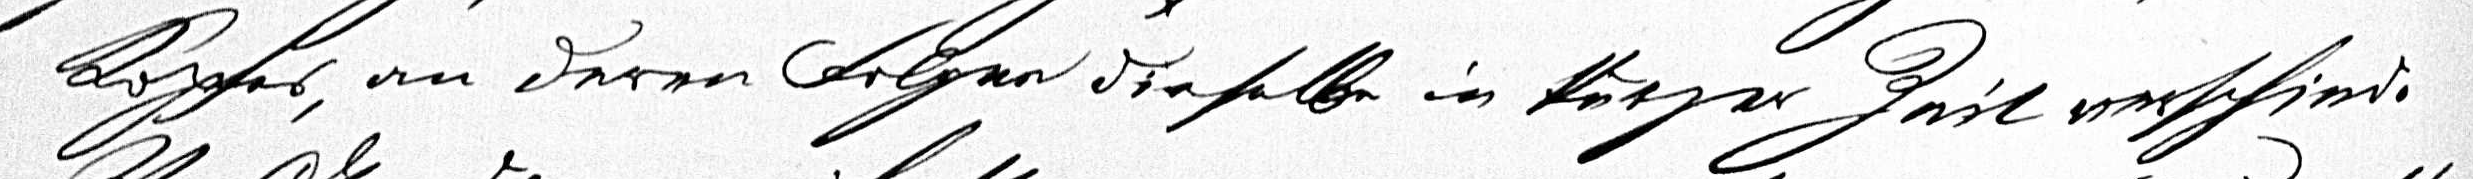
Kopfes, an deren Folgen dieselbe in kürzer Zeig verschied.
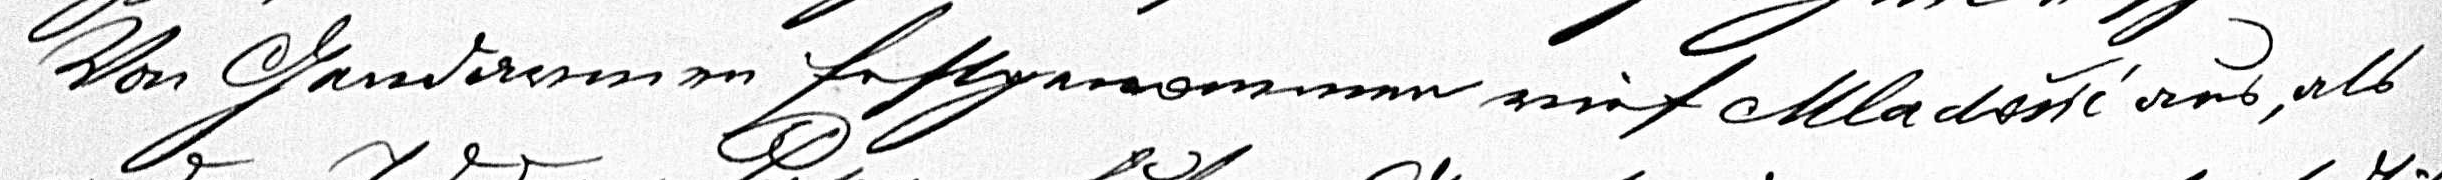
Von Gendarmen festgenommen rief Mladošić aus, als
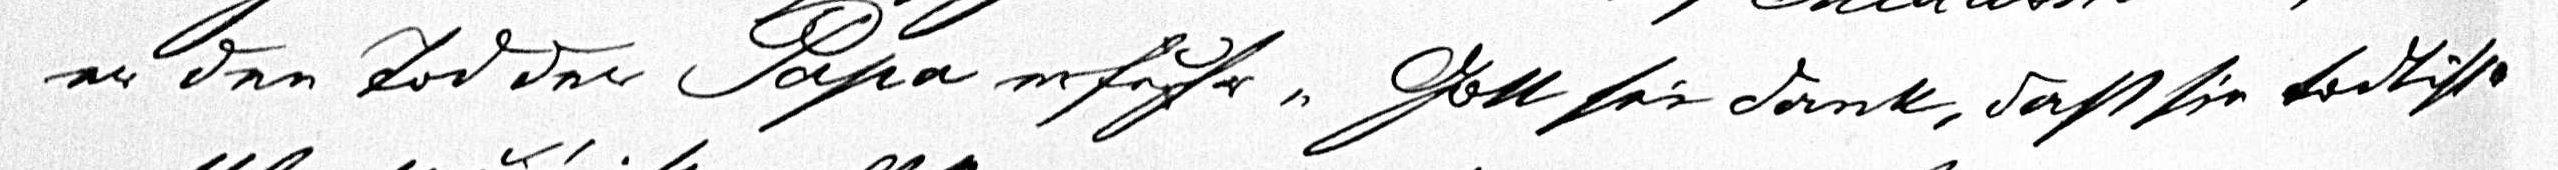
er den Tod der Papa erfuhr „Gott sei dank, daß sie todt ist.
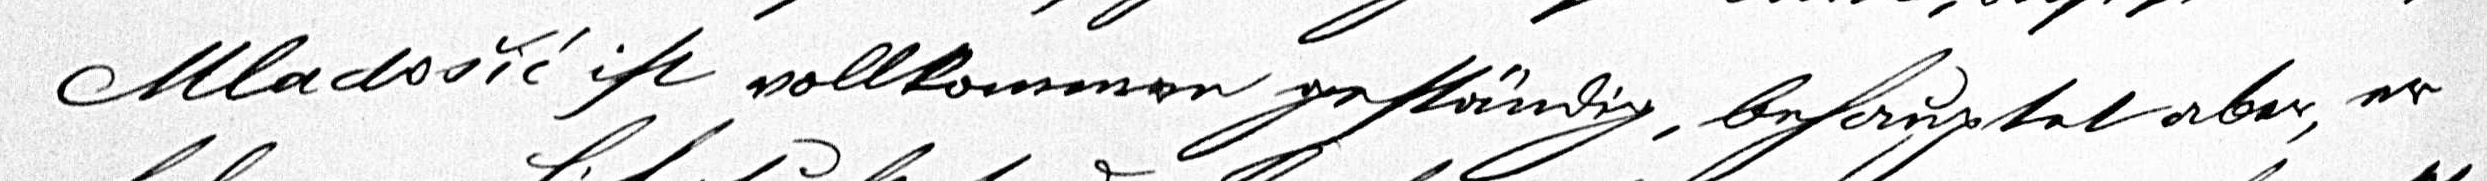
Mladošić ist vollkommen geständig, behauptet aber, er
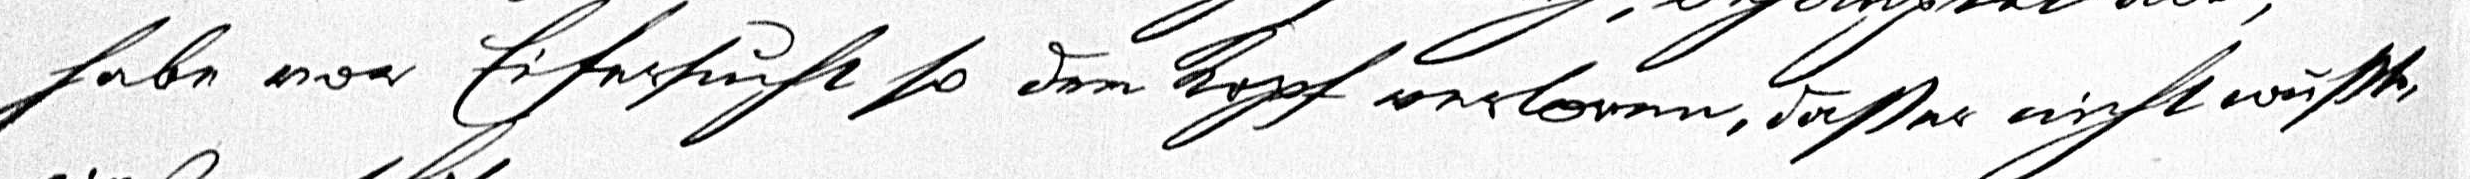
habe von Eifersucht so den Kopf verloren, daß er nicht wußte,
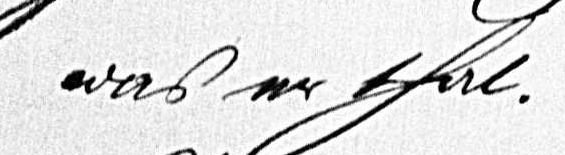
was er that.
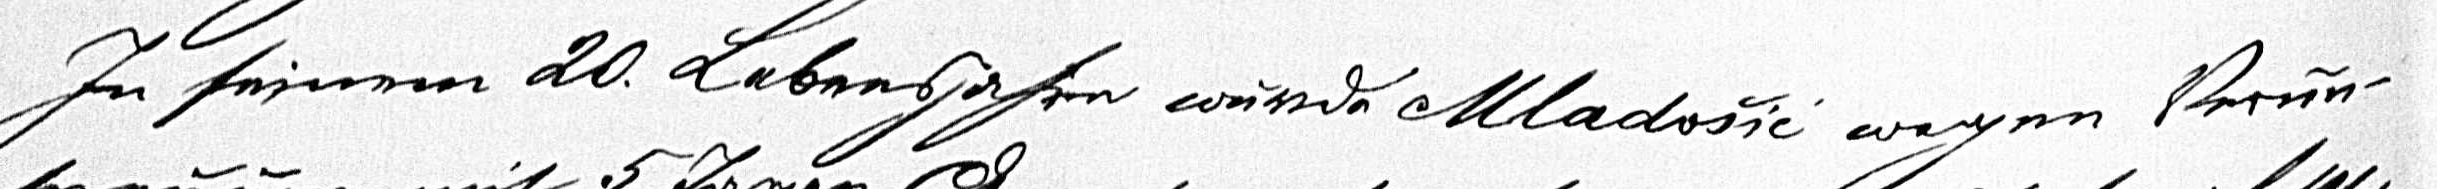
In seinem 20. Lebensjahr wurde Mladošić wegen Verun¬
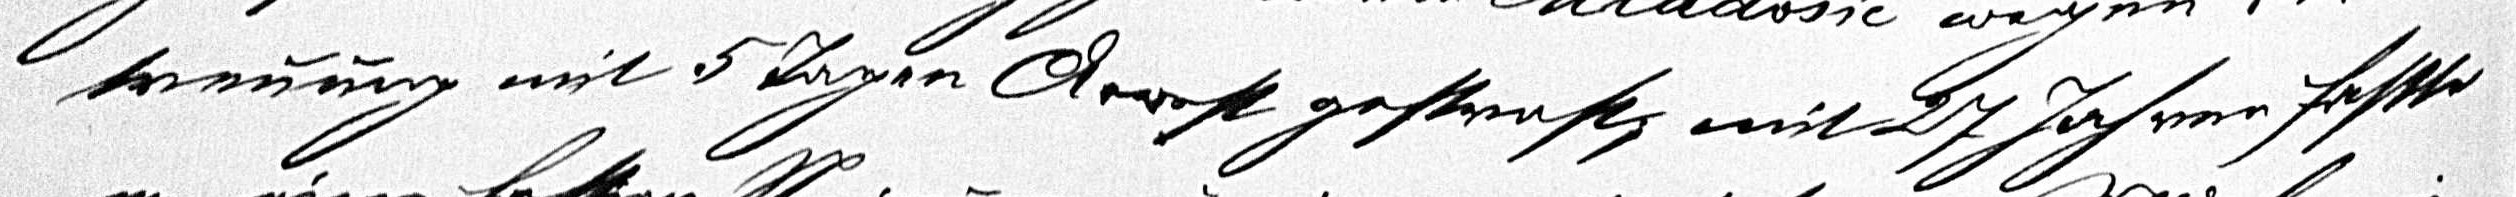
treuung mit 5 Tagen Arrest gestraft, mit 27 Jahren faßte
